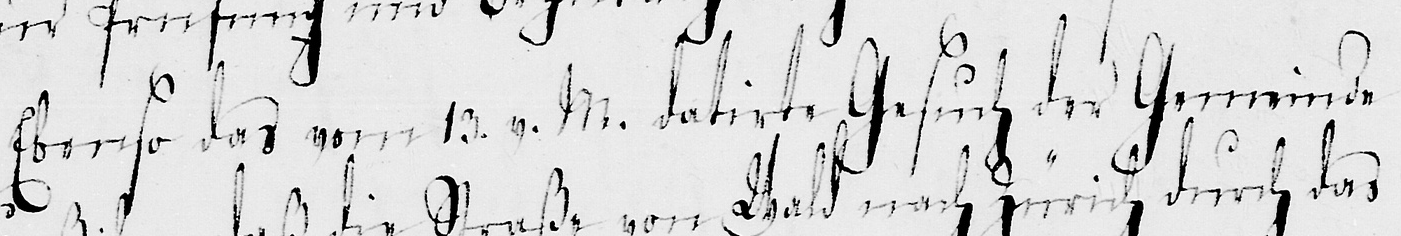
Ebenso das vom 13 v. M. datirte Gesuch der Gemeinde
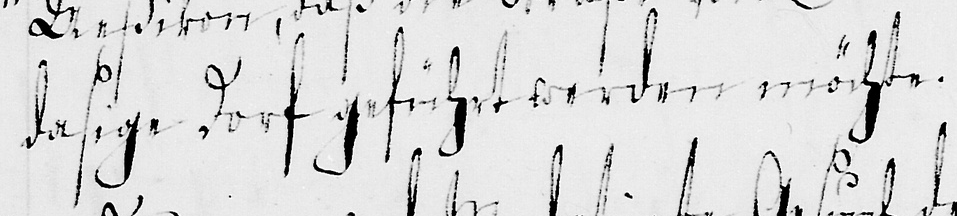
dasige Dorf geführt werden möchte.
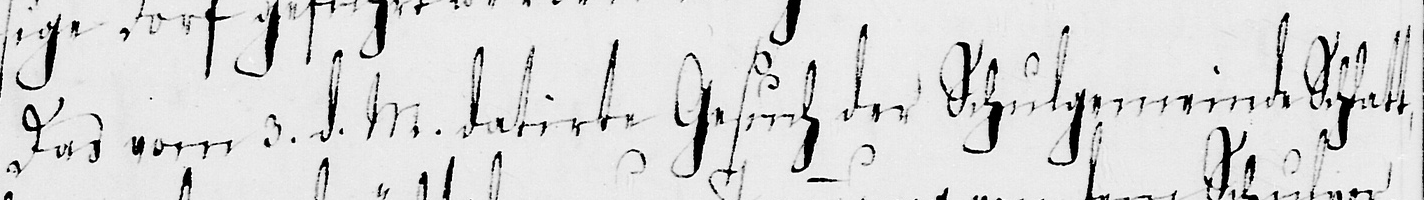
Das vom 3 d. M. datirte Gesuch der Schulgemeinde Schla¬
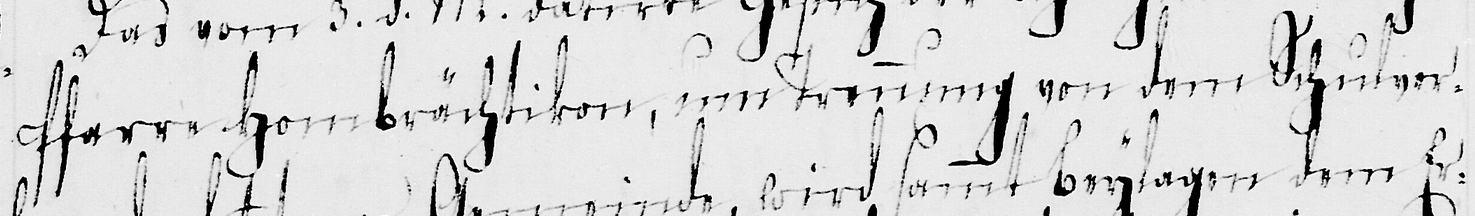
Pfarre Hombrächtikon, um Trennung von dem Schulver¬
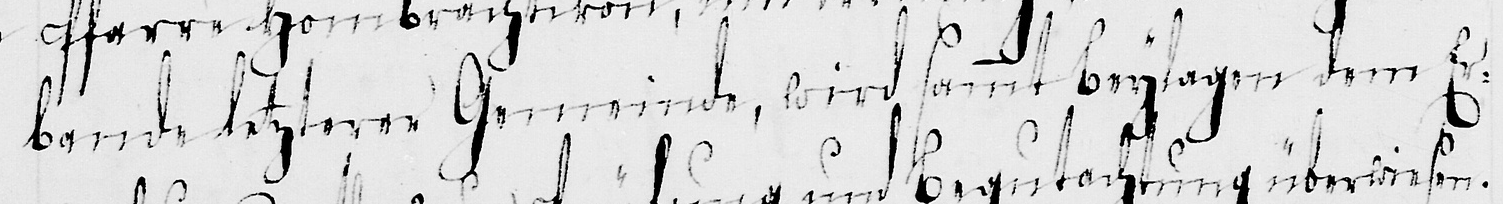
bande letzterer Gemeinde, wird sammt Beylagen dem Er¬
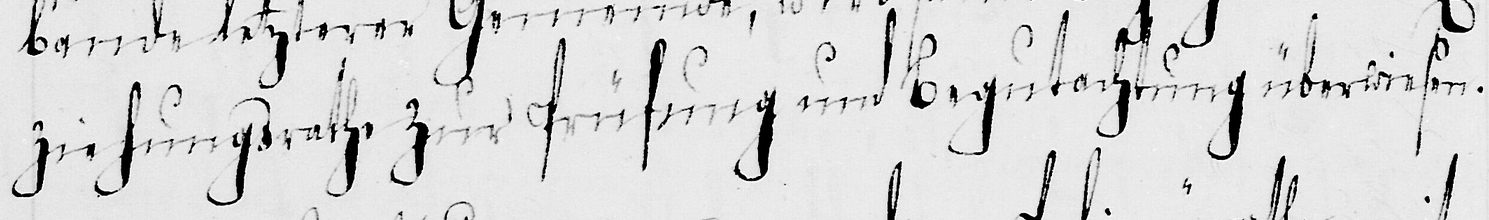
ziehungsrathe zur Prüfung und Begutachtung überwiesen.
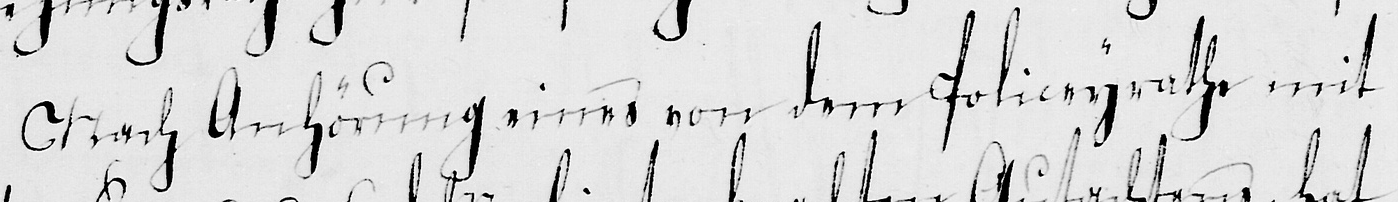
Nach Anhörung eines von dem Policeyrathe mit
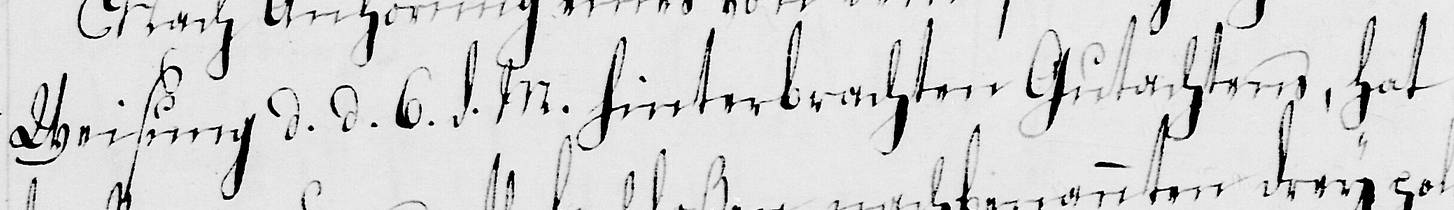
Weisung d. d. 6. d. M. hinterbrachten Gutachtens, hat
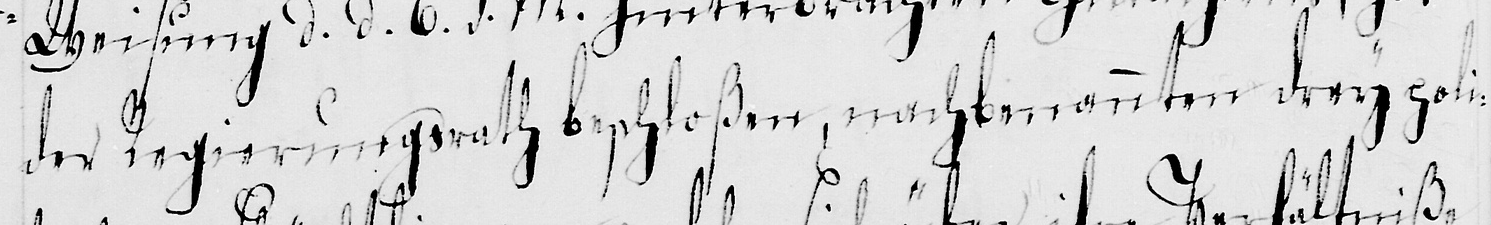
der Regierungsrath beschlossen, nachbenannten drey poli¬
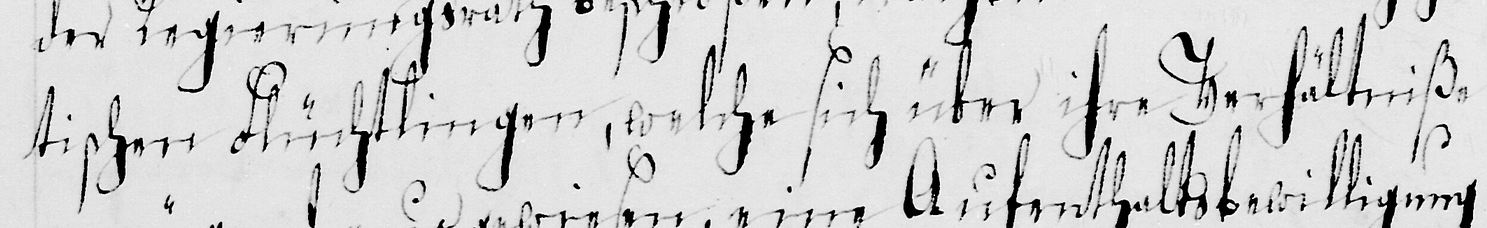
tischen Flüchtlingen, welche sich über ihre Verhältnis¬
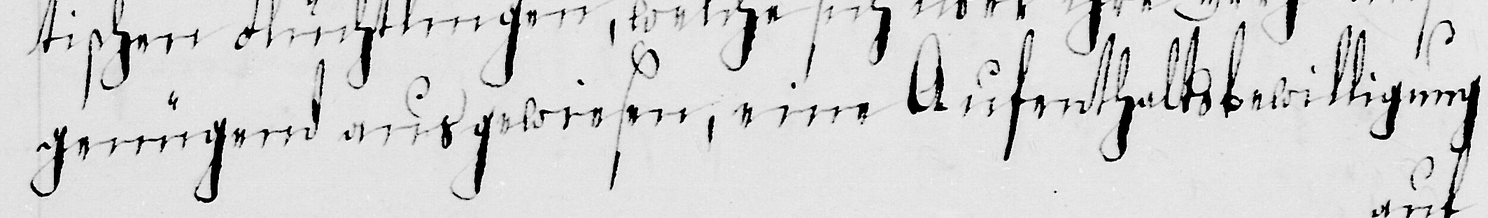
genügend ausgewiesen, eine Aufenthaltsbewilligung
